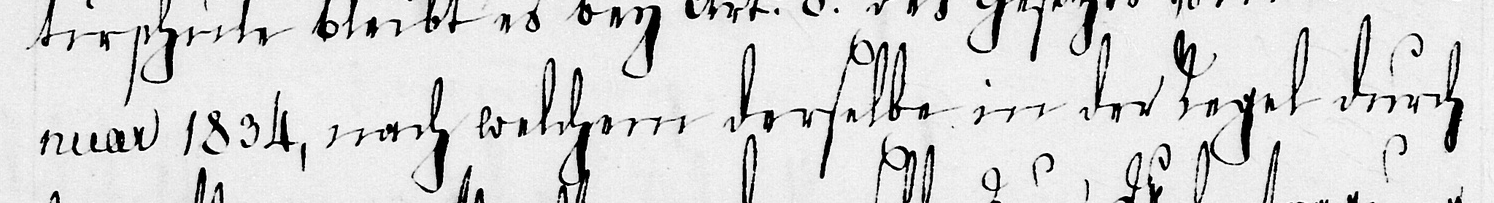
nuar 1834, nach welchem derselbe in der Regel durch
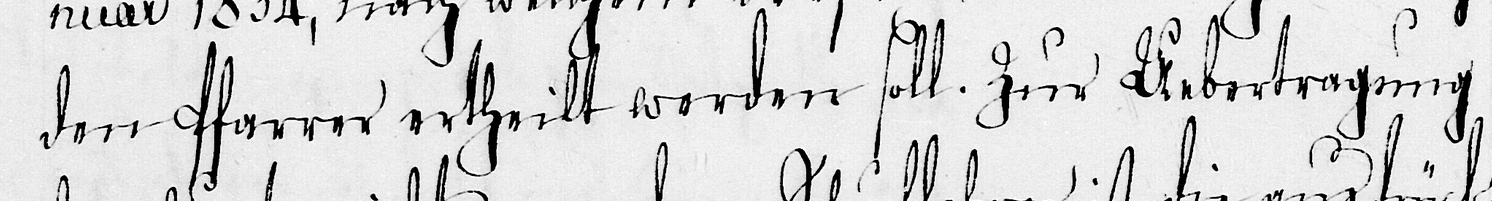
den Pfarrer ertheilt werden soll. Zur Uebertragung
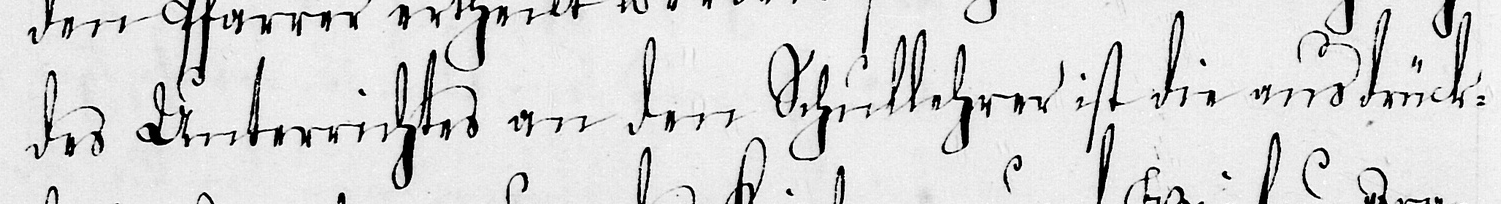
des Unterrichtes an den Schullehrer ist die ausdrück¬
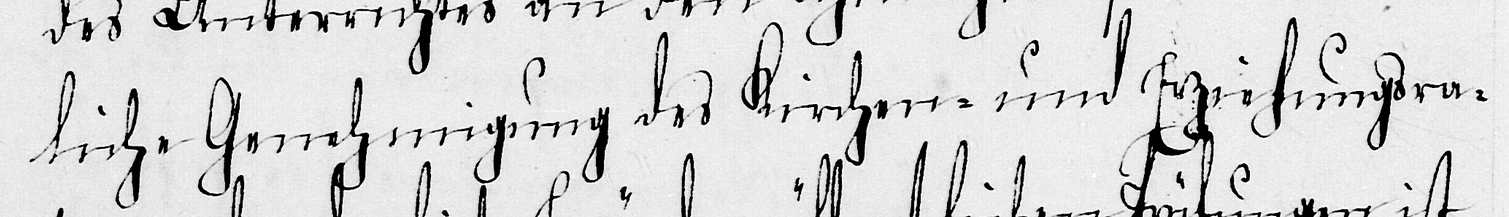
liche Genehmigung des Kirchen- und Erziehungsra¬
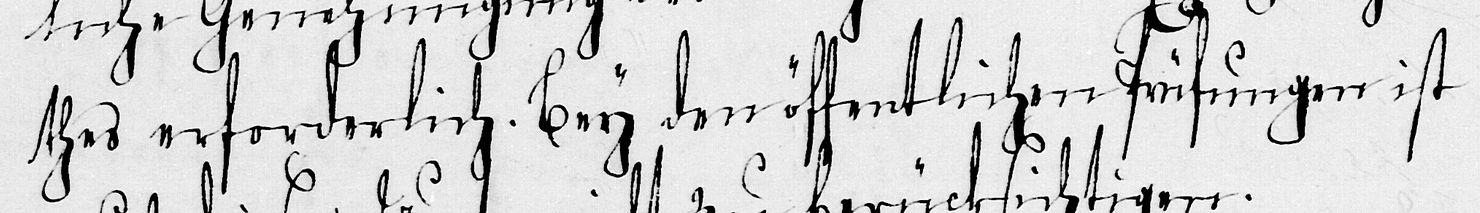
thes erforderlich. Bey den öffentlichen Prüfungen ist
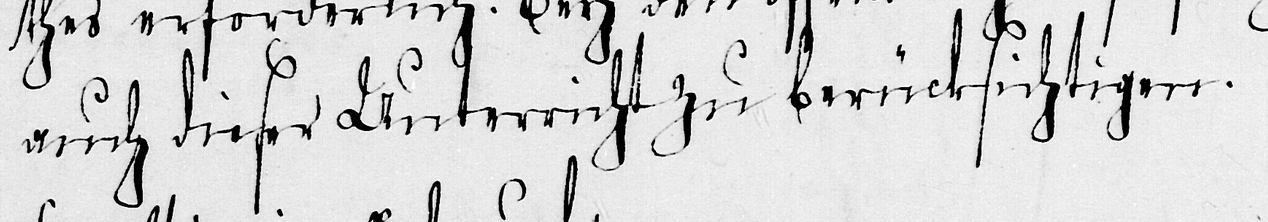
auch dieser Unterricht zu berücksichtigen.
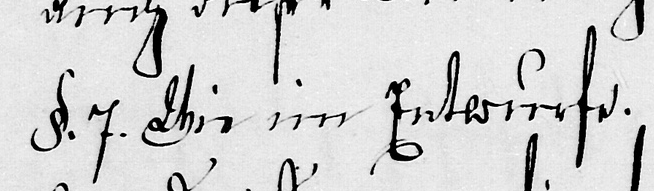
§. 7. Wie im Entwurfe.
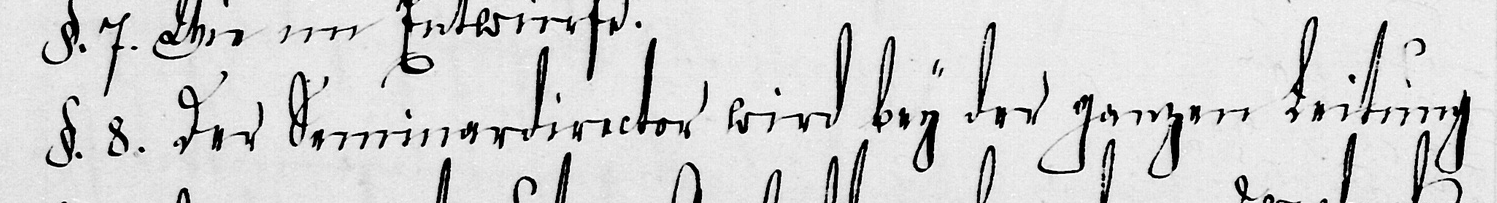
§. 8. Der Seminardirector wird bey der ganzen Leitung
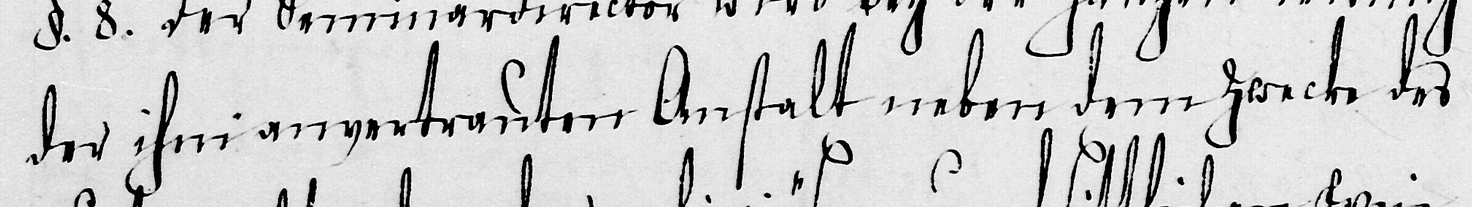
der ihm anvertrauten Anstalt neben dem Zwecke des
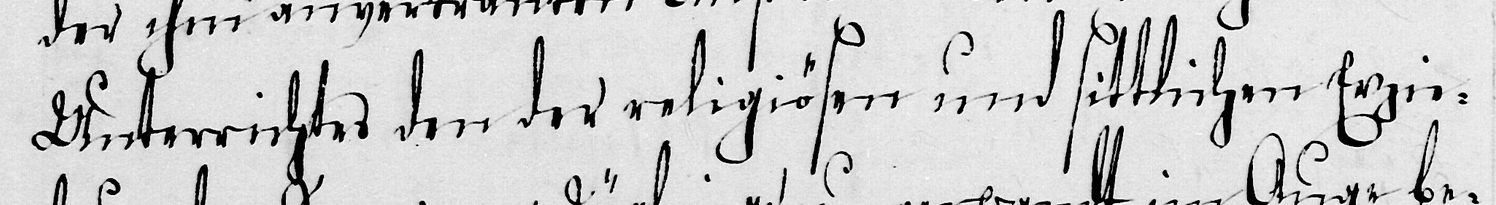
Unterrichtes den der religiösen und sittlichen Erzie¬
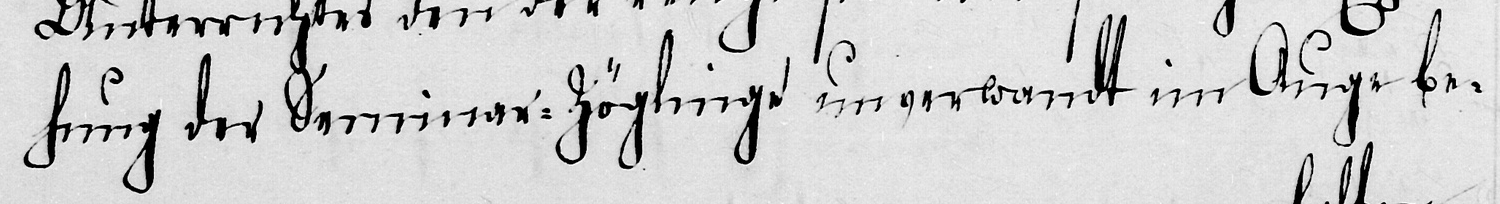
hung der Seminar-Zöglinge unverwandt im Auge be-
